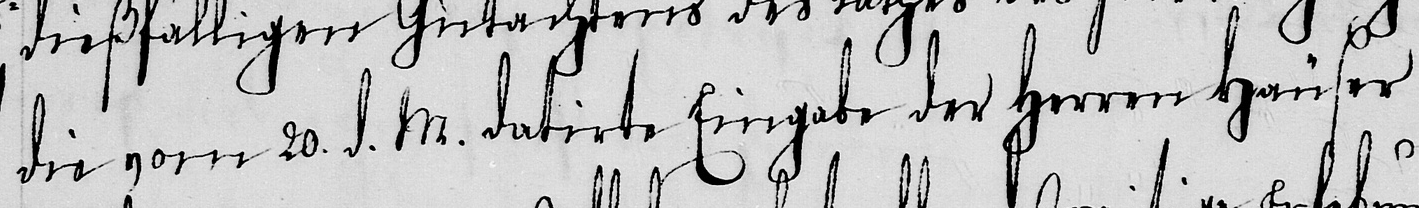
die vom 20. d. M. datirte Eingabe der Herren Häuser
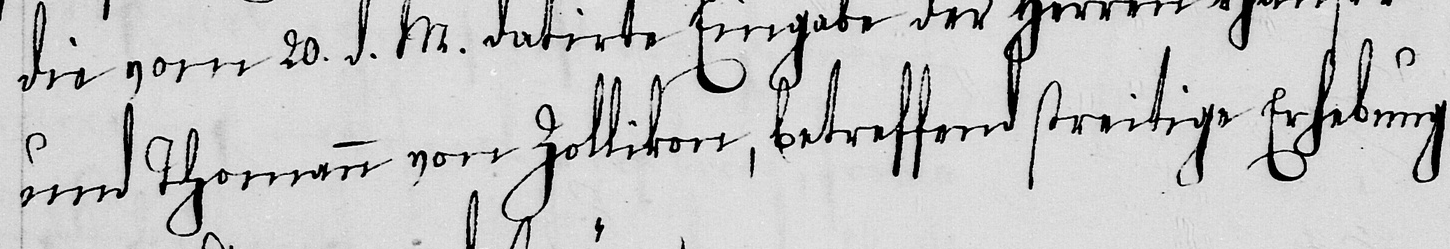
und Thomann von Zollikon, betreffend streitige Erhebung
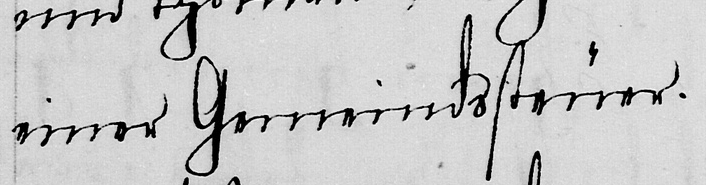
einer Gemeindssteuer.
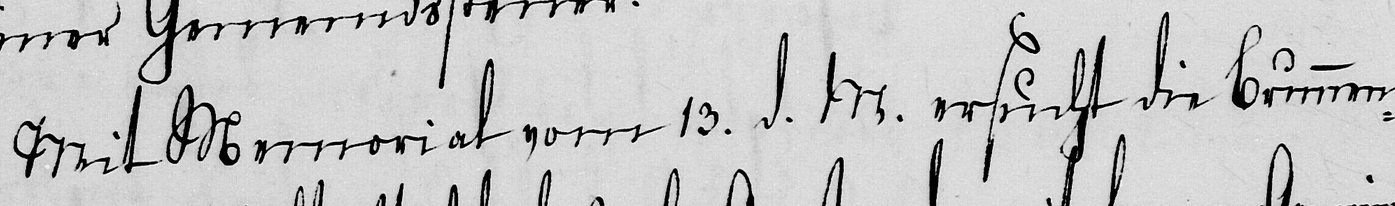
Mit Memorial vom 13. d. M. ersucht die Brunnen¬
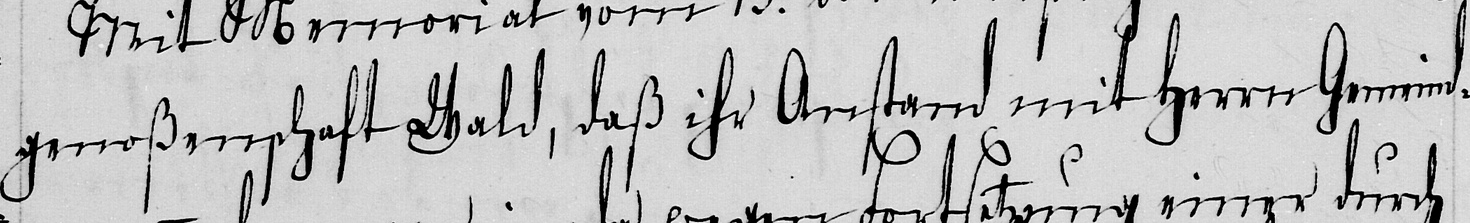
genoßenschaft Wald, daß ihr Anstand mit Herrn Gemeind¬
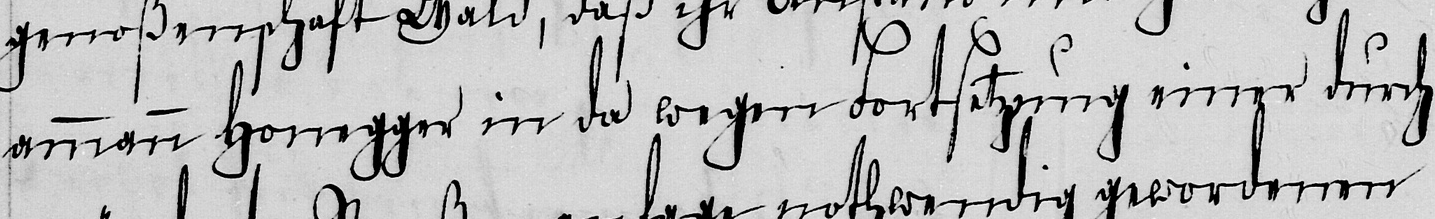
ammann Honegger in da wegen Fortbesetzung einer durch
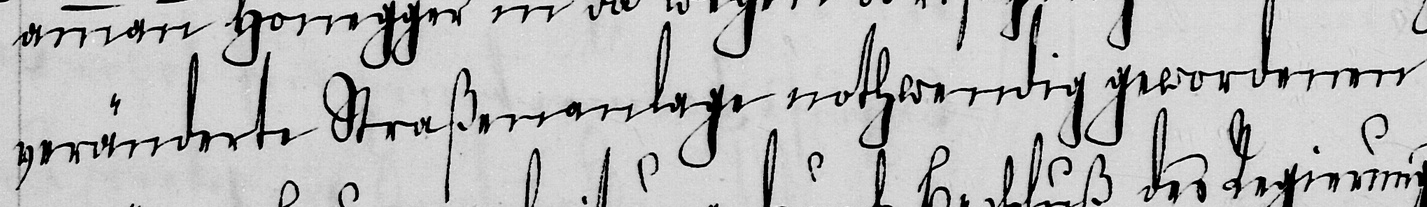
veränderte Straßenanlage nothwendig gewordenen
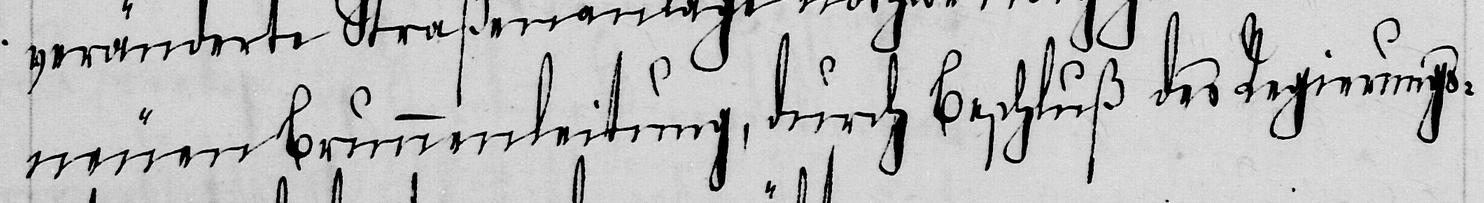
neuen Brunnenleitung, durch Beschluß des Regierungs¬
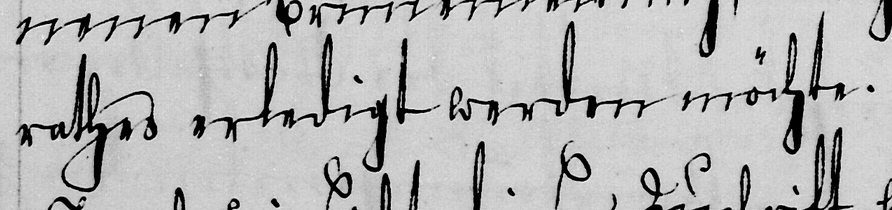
rathes erledigt werden möchte.
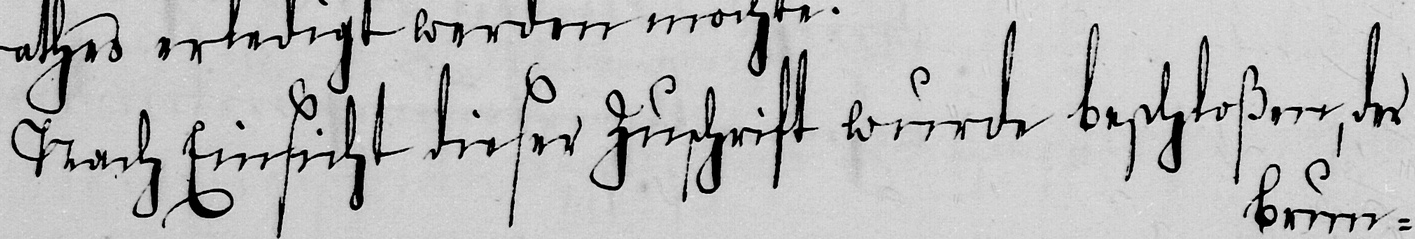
Nach Einsicht dieser Zuschrift wurde beschloßen, der
